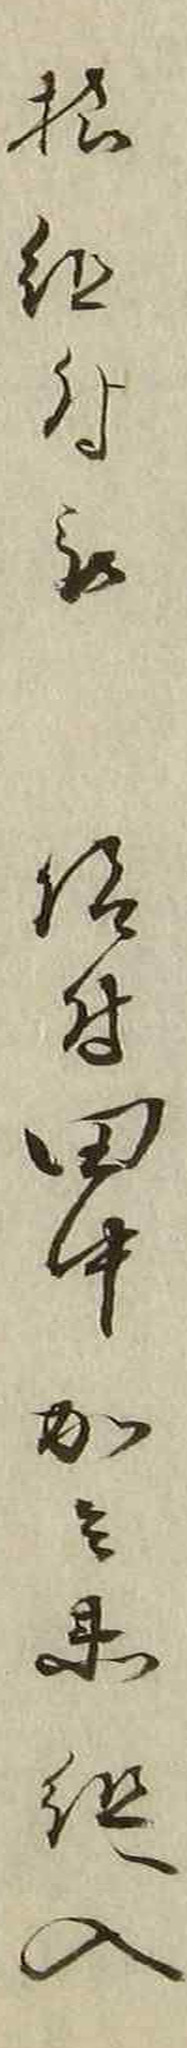様組付被仰付田中加兵衛組へ入
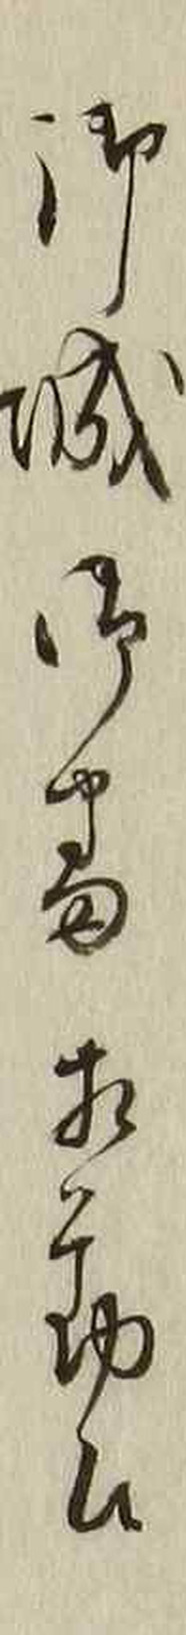御城御番相勤候
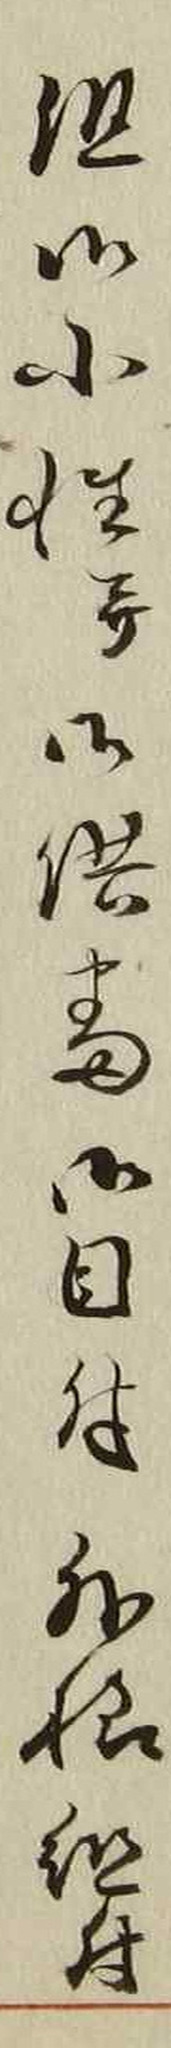但御小性并御供番御目付外様組付
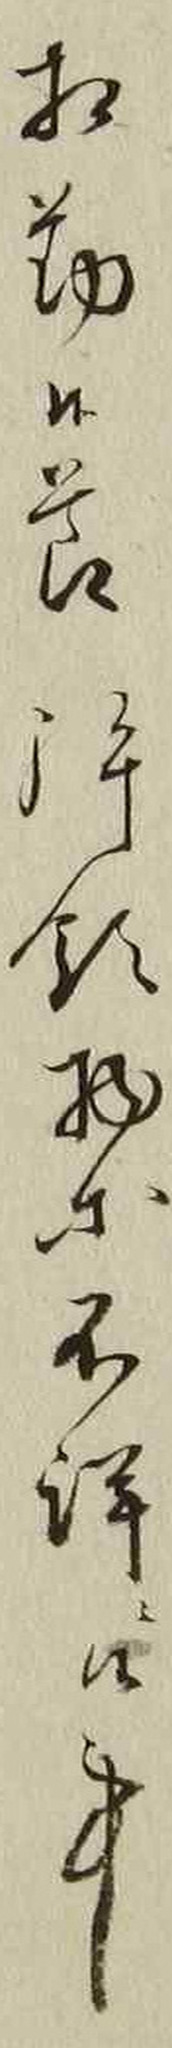相勤候節拝領物等不詳ニ候事
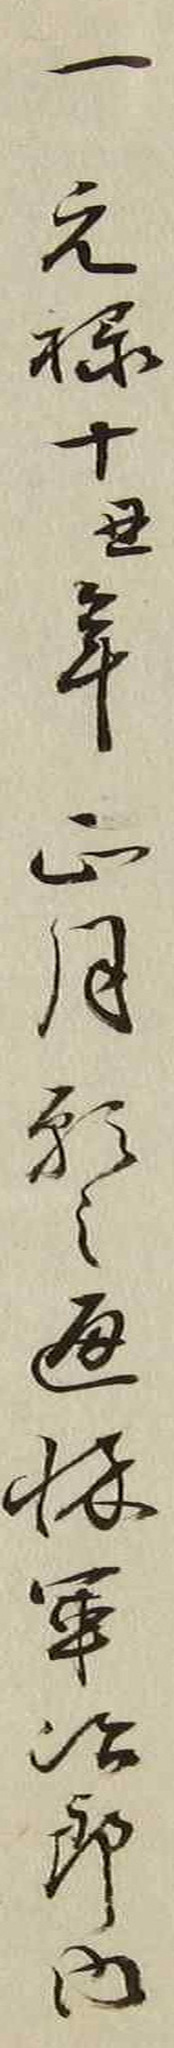一元禄十丑年正月願之通悴軍治郎内
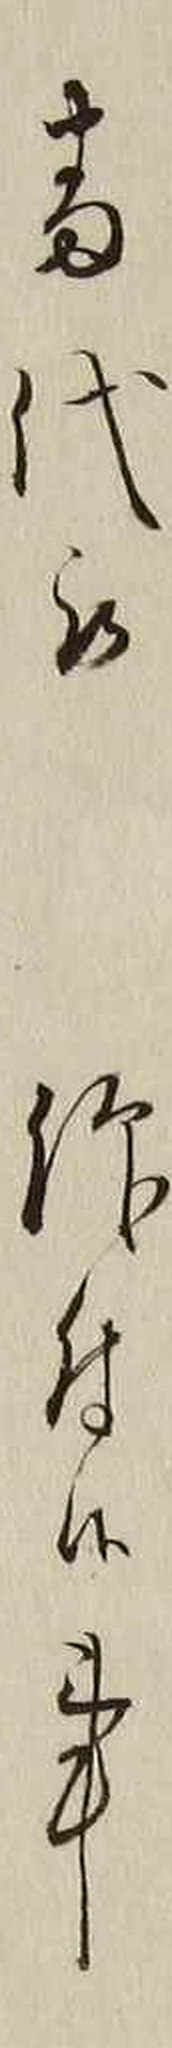番代被仰付候事
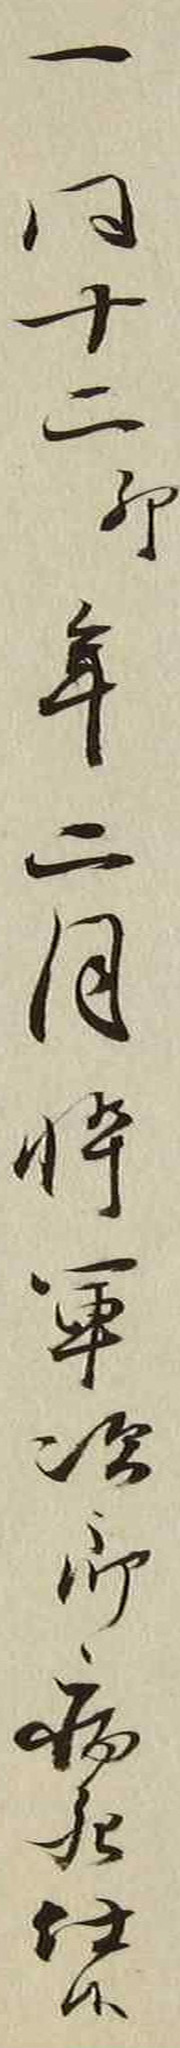一同十二卯年二月忰軍次郎病死仕候
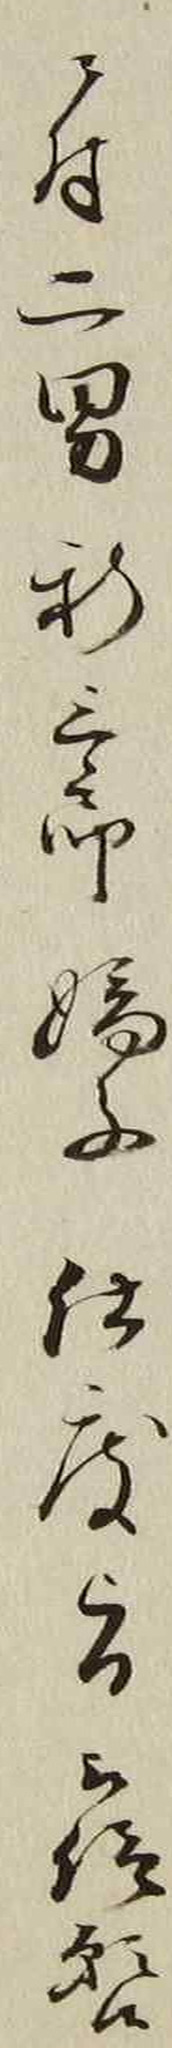ニ付二男新三郎嫡子仕度旨被仰願候
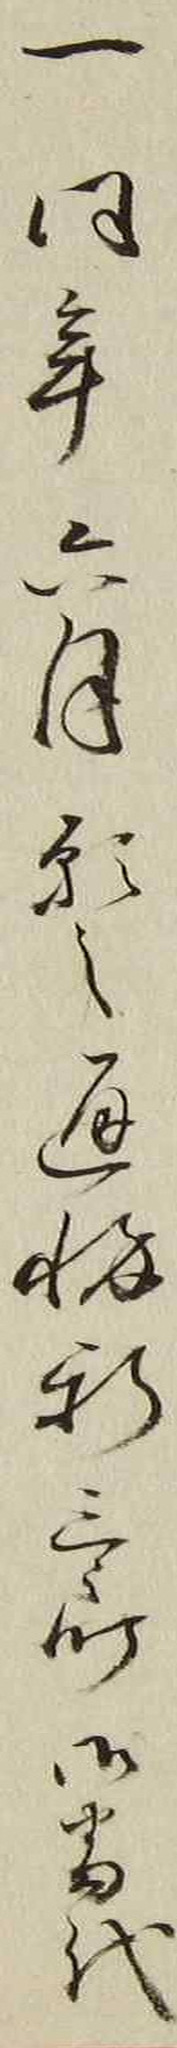一同年六月願之通悴新三郎御番代
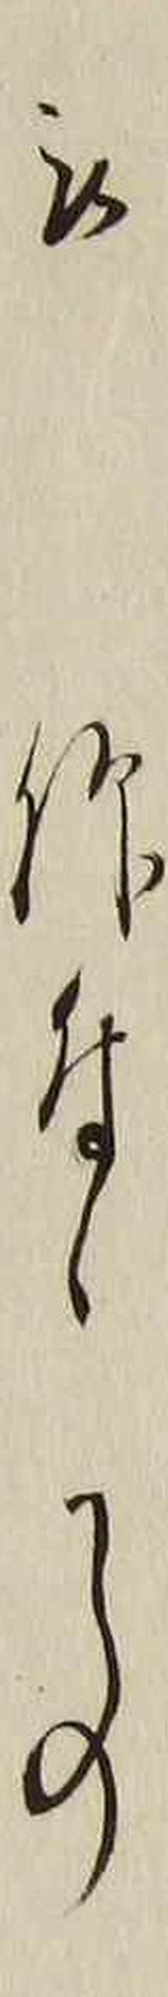被仰付候事
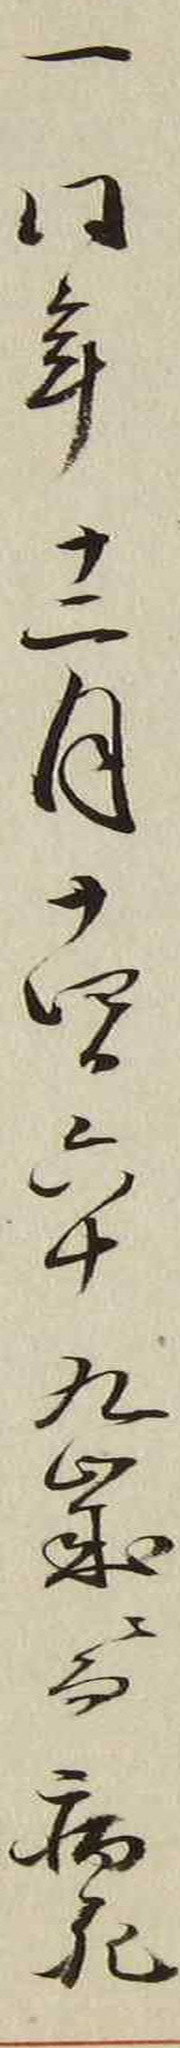一同年十二月十四日六十九歳ニ而病死
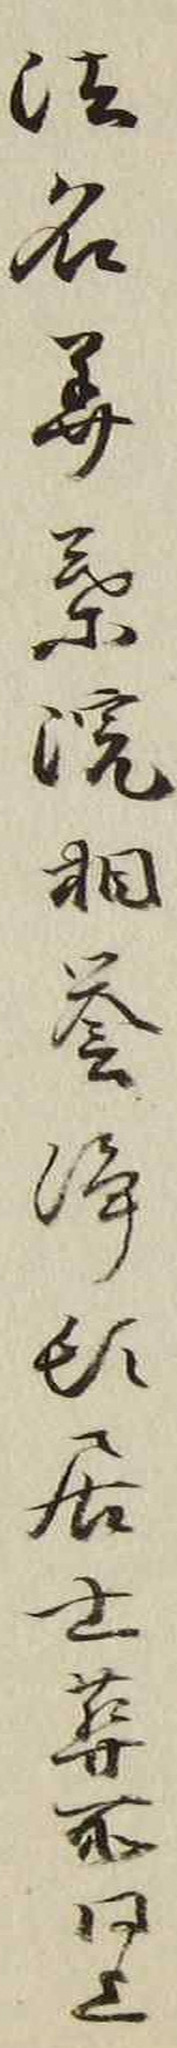法名華葉院相誉浄頓居士葬所同上

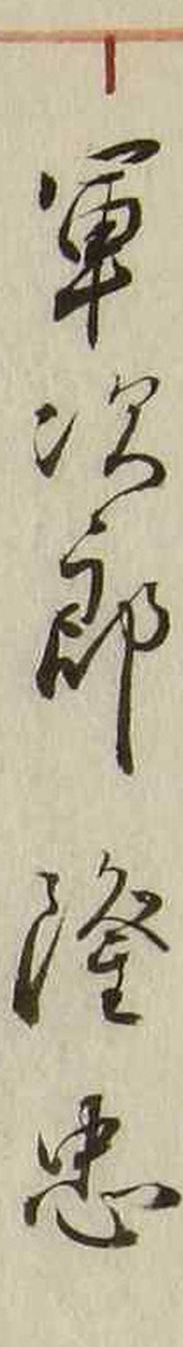軍次郎隆忠
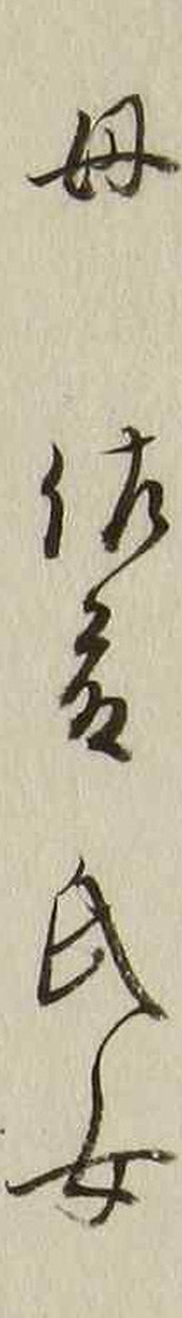母佐藤氏女
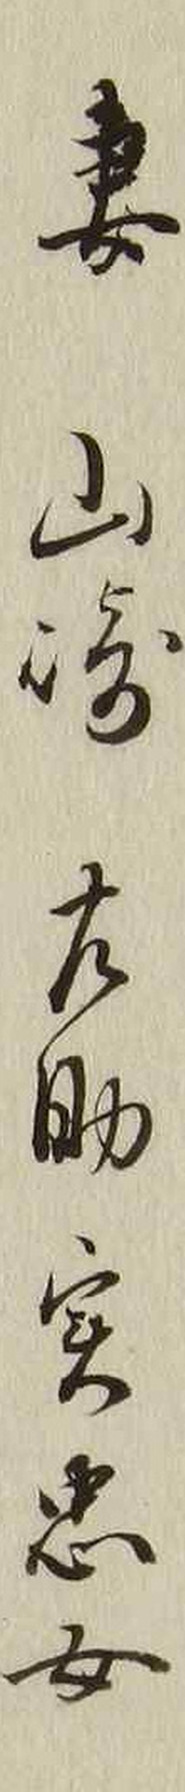妻山崎左助実忠女
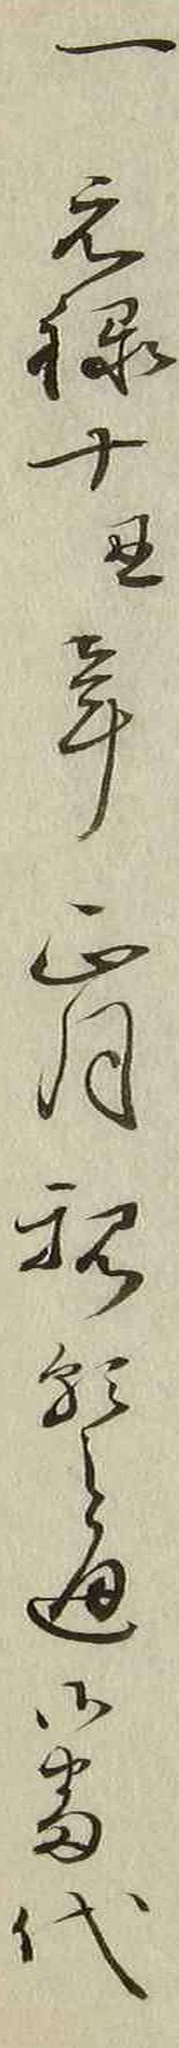一元禄十丑年正月親願之通御番代
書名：諸士系譜　巻之28　い之部28
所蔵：会津若松市立会津図書館
